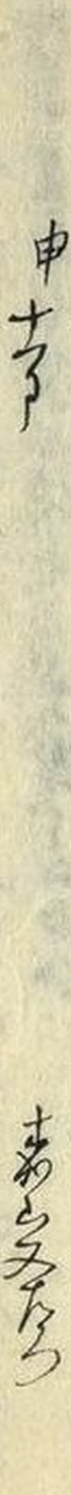申十一月森山又左衛門
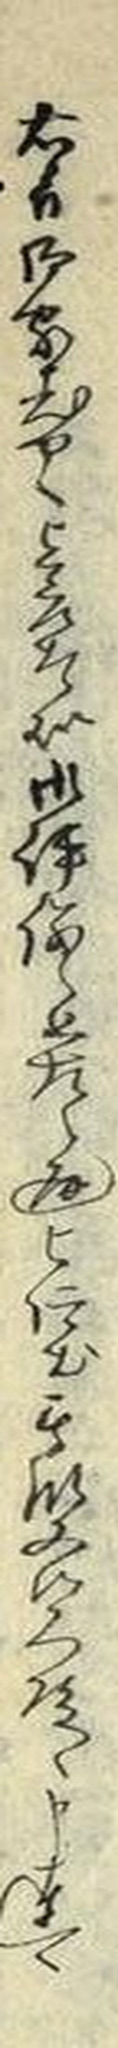右ニ付御家老中へ被差出候処御評議之上左之通被仰出其段又左衛門へ申達候
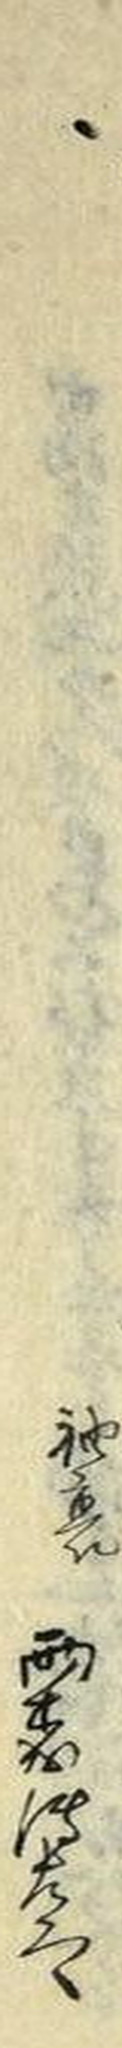袖裏雨森伝左衛門

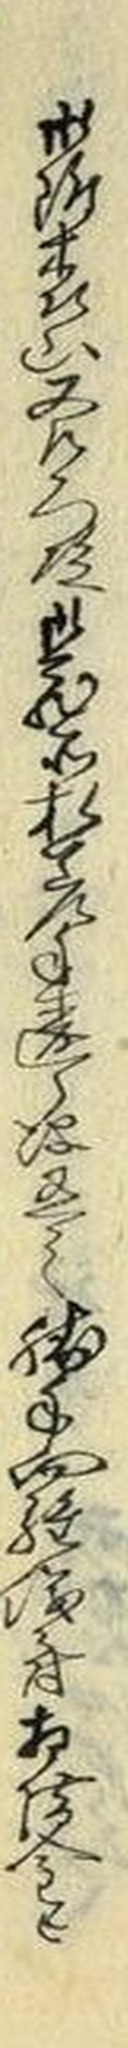御附森山又左衛門殿御蔵所札差手違之儀有之勝手向難儀ニ付拝借金被
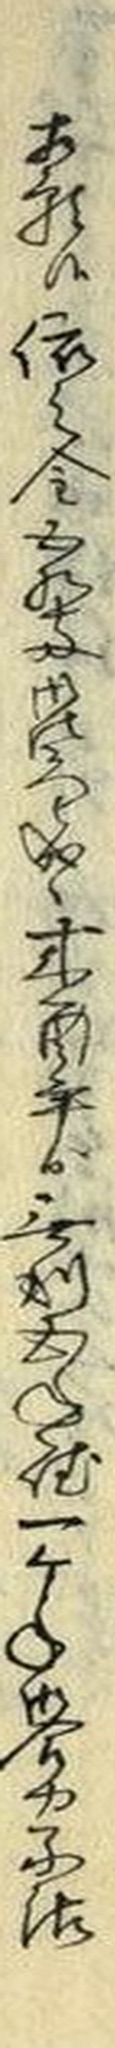相願候依之金五拾両御貸被成候来酉年ゟ無利五年賦一ケ年御合力米銀
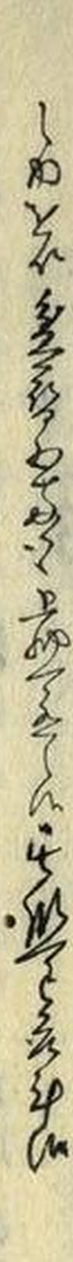之内を以盆暮五両ツヽ上納可有之候其段可被取計候
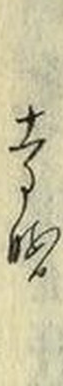十一月晦日
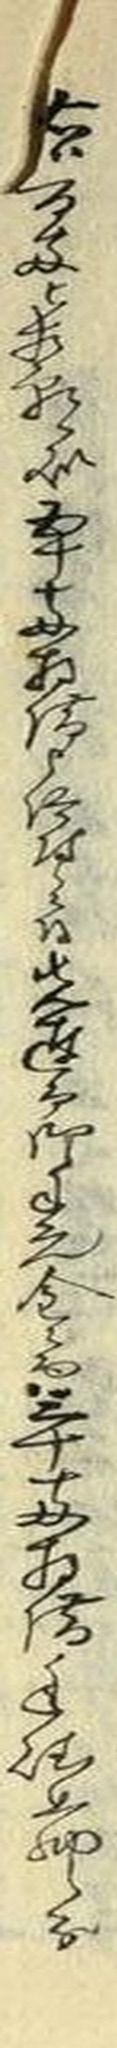右ハ百両被相願候処五十両拝借被仰付候ニ付先達而御手元金ニ而三十両拝借年賦上納之分
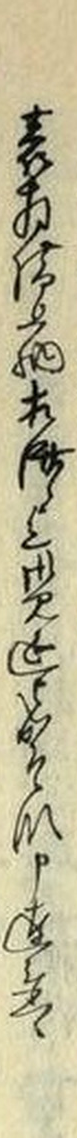表拝借上相済候迄御見延被成下候段申達置候
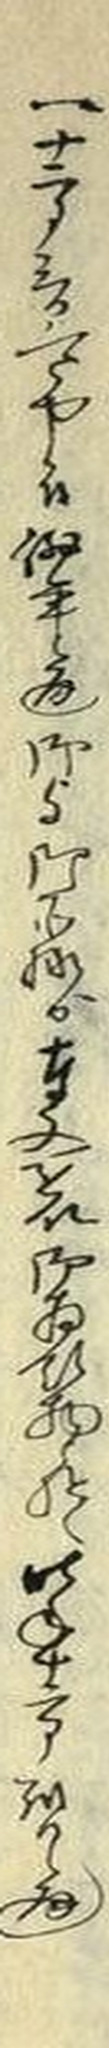一十二月三日寒中ニ付例年之通御与御所様ゟ奉文を以御拝領物被遊候昨年十二月朔日之通
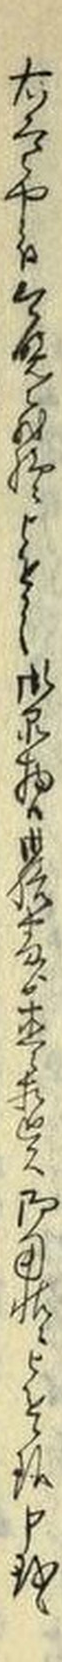右寒中ニ付今晩飛脚被進之御品物ハ御膳番ゟ直ニ相廻ス御用状ニ被進候趣申越候
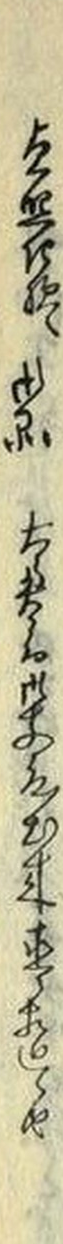貞照院様へ御品大奥ニ而御支度出来直ニ相廻候由
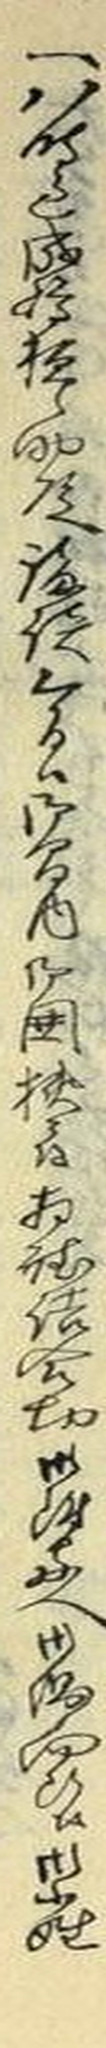一八時過成嶋桓之助殿講談今日ハ御間内御囲狭ニ付拝聴詰合切御附両人御側向頭取御小姓
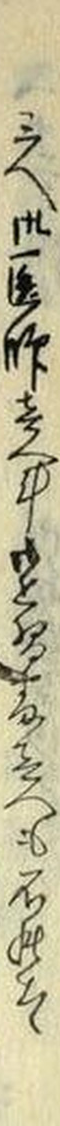三人御医師壱人斗御近習番壱人も不罷出候
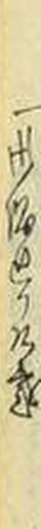御側廻り頂戴
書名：少傅日録抄（斉善付側向頭取日記、在府）
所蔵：福井県文書館 Fukui Prefectural Archives
